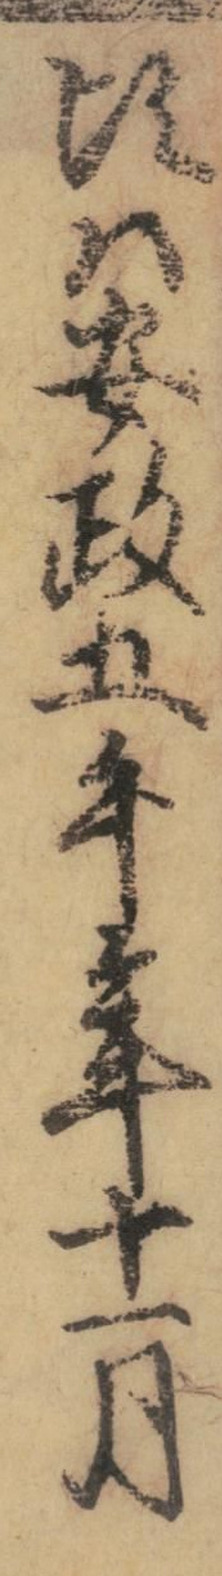頃は安政五丑午年十一月
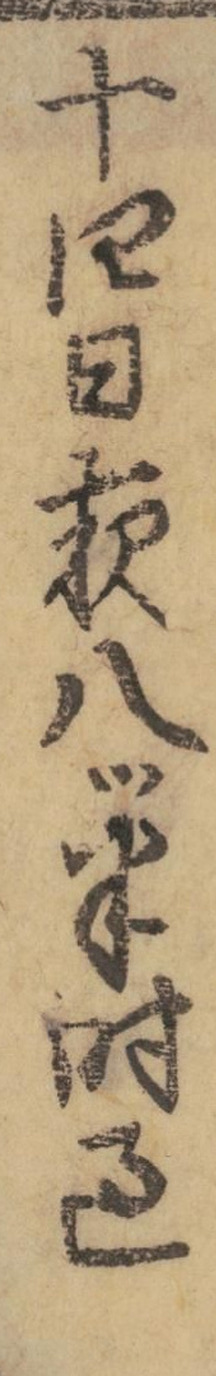十四日夜八ツ半時過
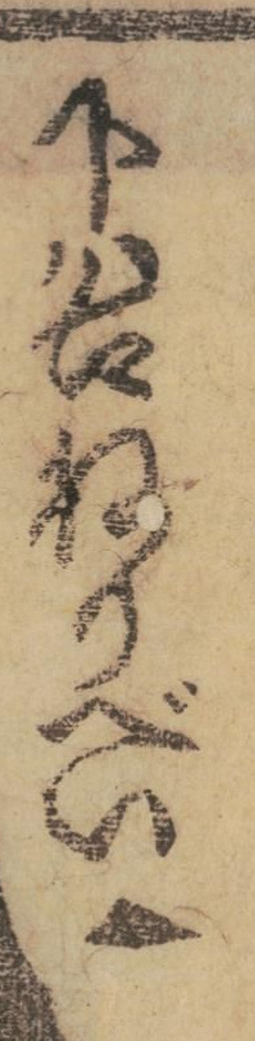下谷ねりべい▲
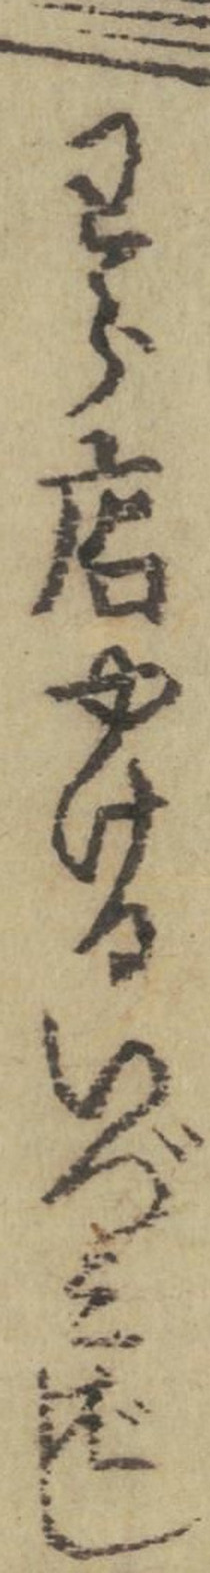わら店やけるいづみばし
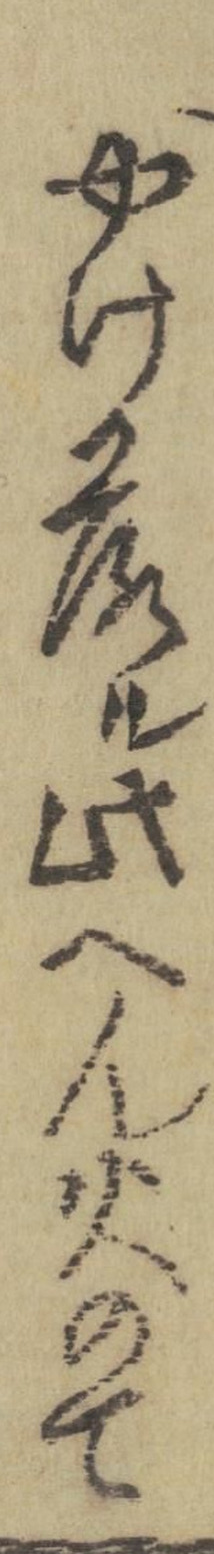やけ落ル此へん火のて
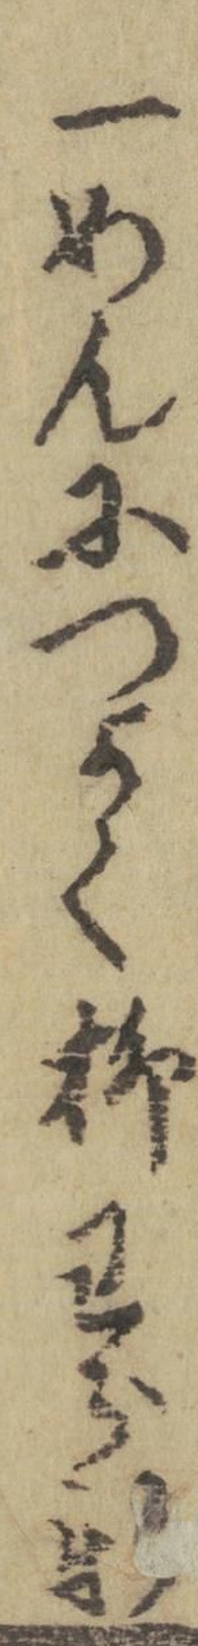一めんにつよく柳わら新
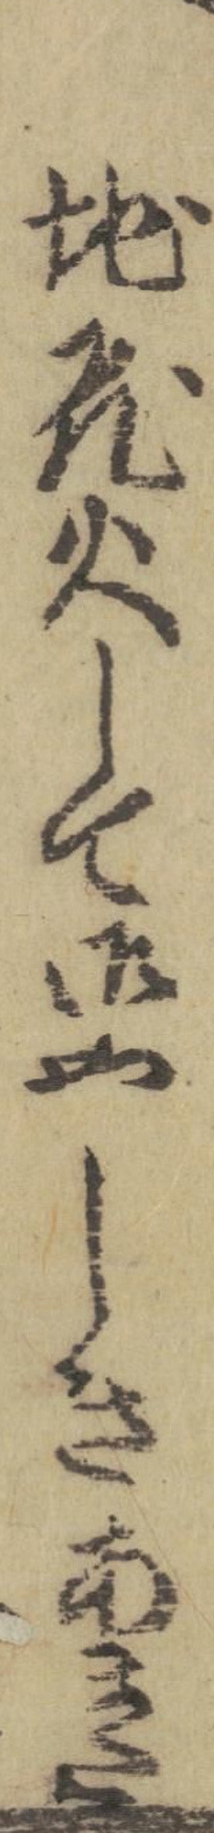地飛火して御やしきあまた
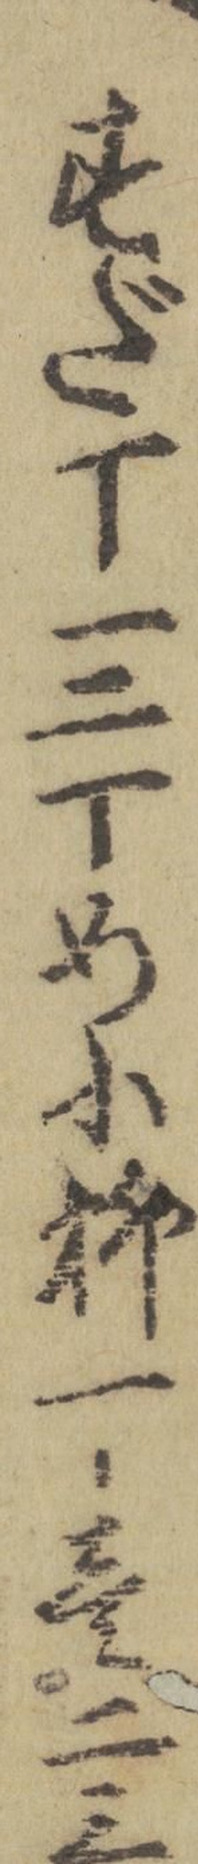すだ丁一二丁め小柳丁壱二三
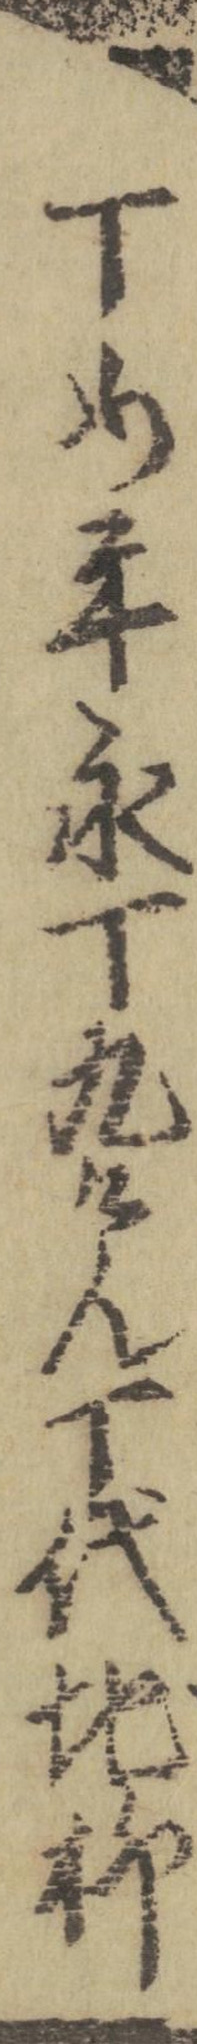丁め平永丁九けん丁代地柳
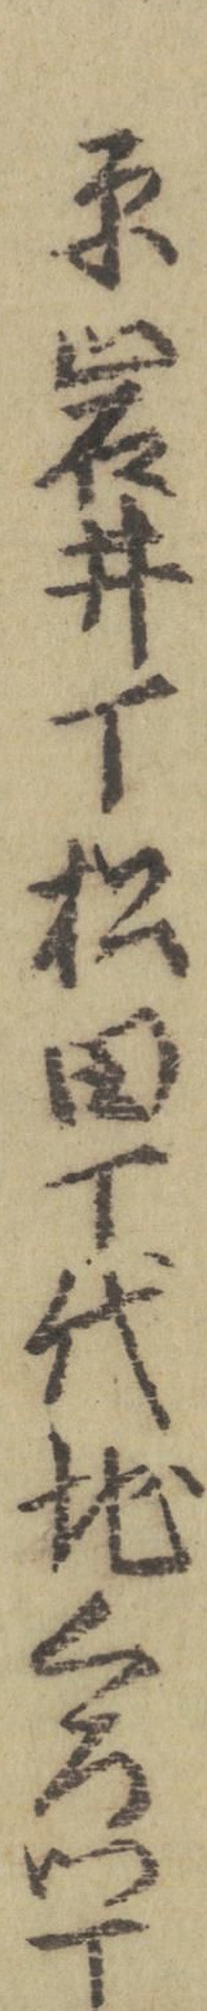原岩井丁松田丁代地くろ門丁
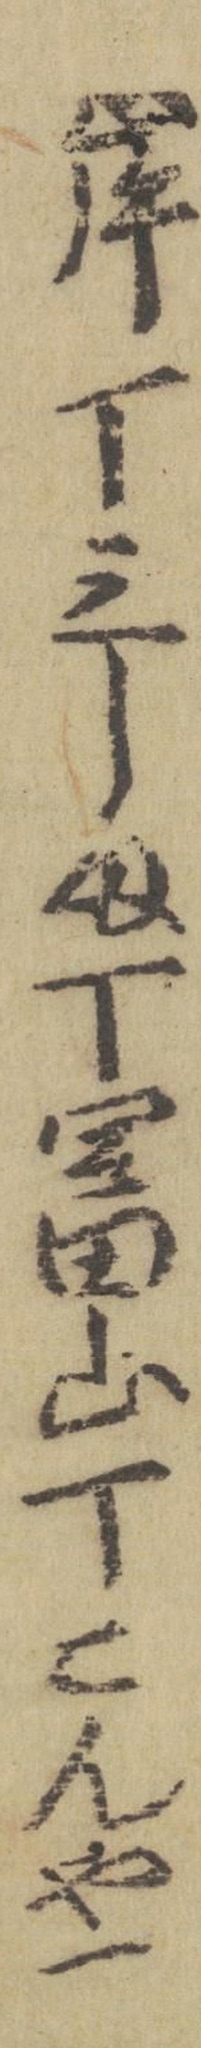岸丁みしま丁冨山丁こんや一
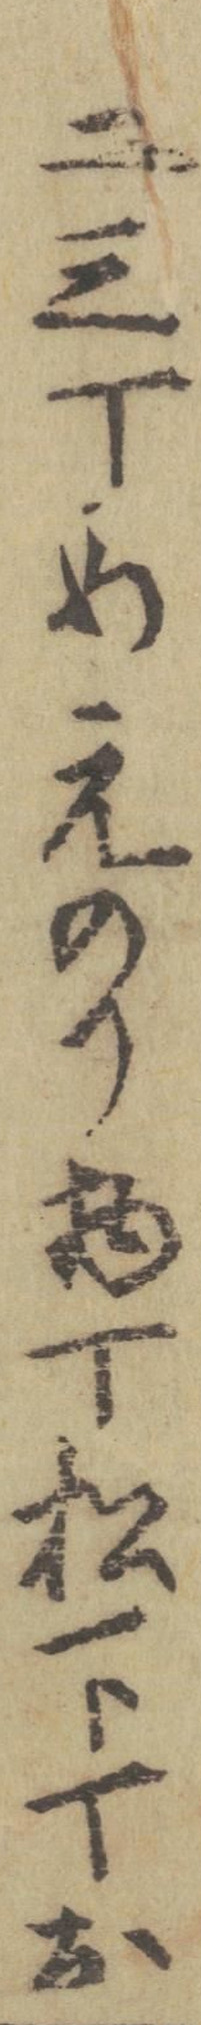二三丁め元のり物丁松下丁お
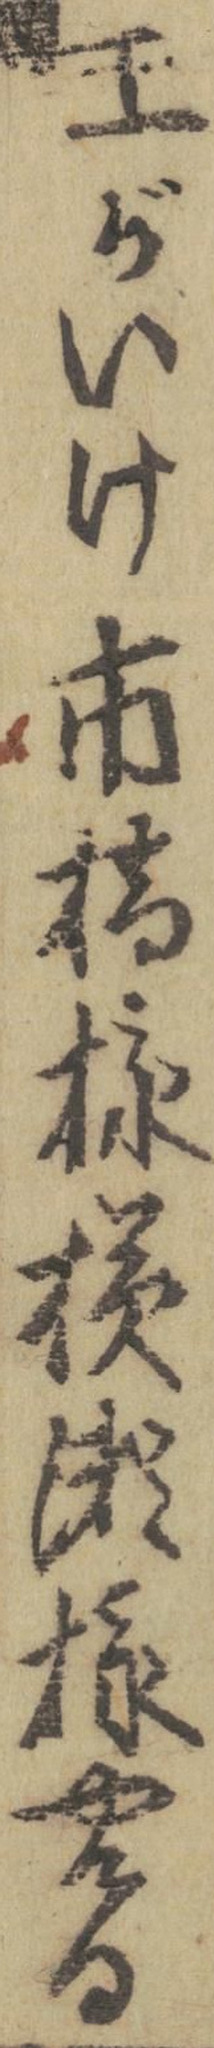玉がいけ市橋様横瀬様やける
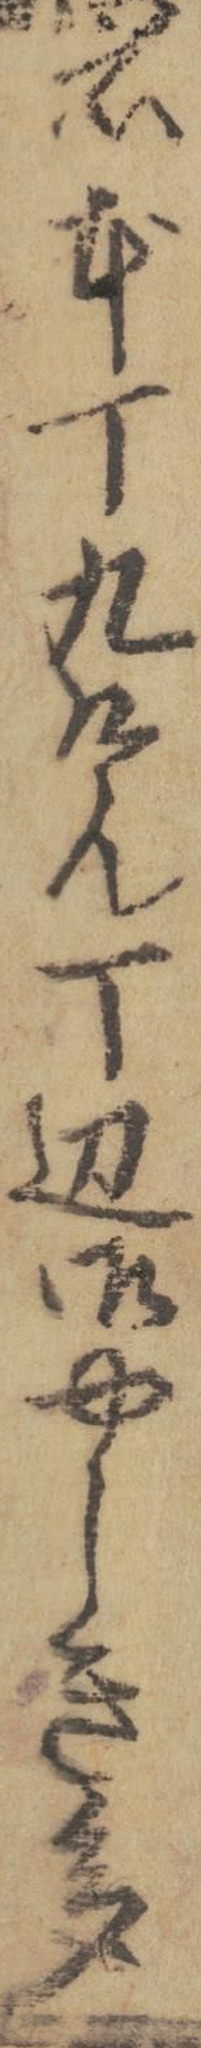岩本丁九けん丁辺御やしき多
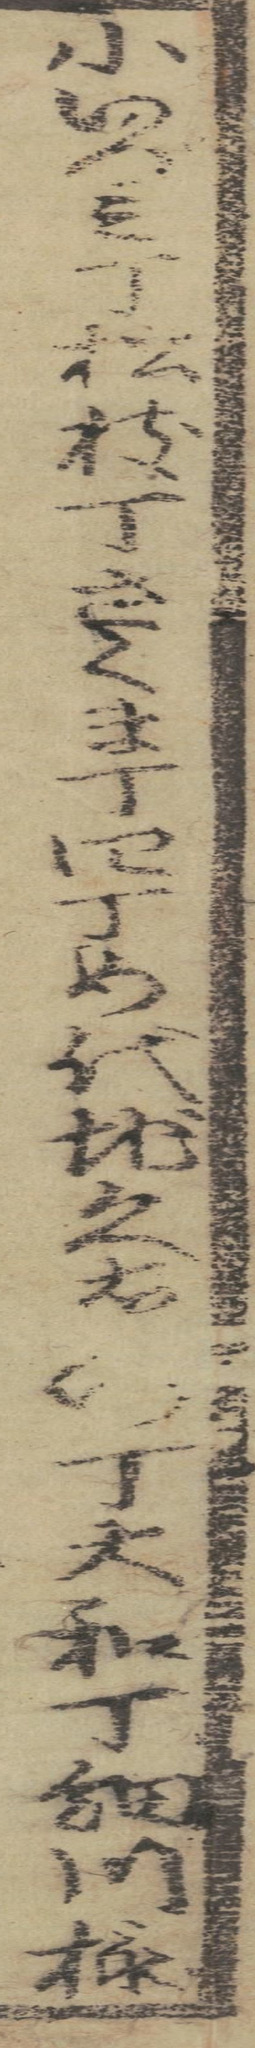小いつみ丁松枝丁さくま丁四丁め代地久右衛門丁大和丁細川様
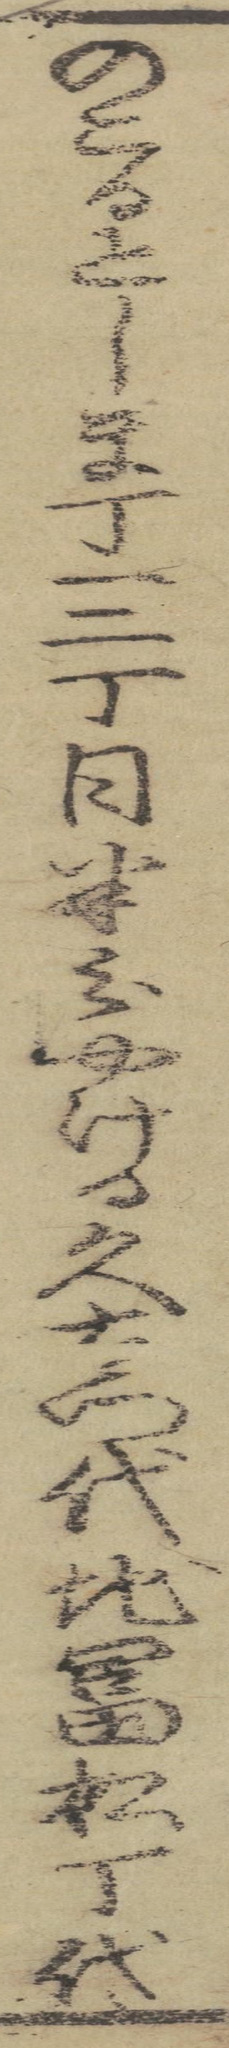のこるとしま丁一二丁目半分やける久右衛門代地冨松丁代
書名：[安政五年十一月の江戸大火に関する瓦版]
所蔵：東京大学地震研究所図書室 Earthquake Research Institute Library, The University of Tokyo, JAPAN
